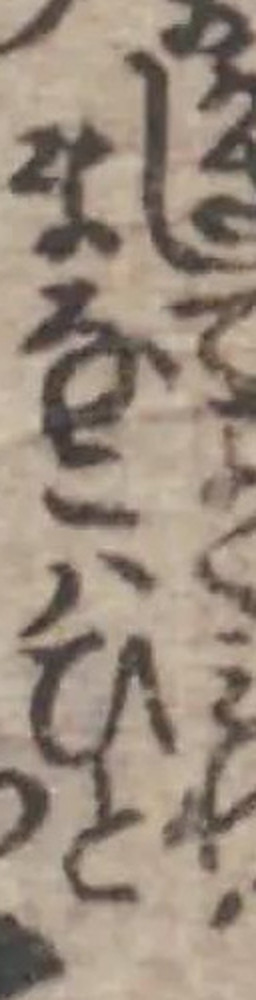まなこはひと
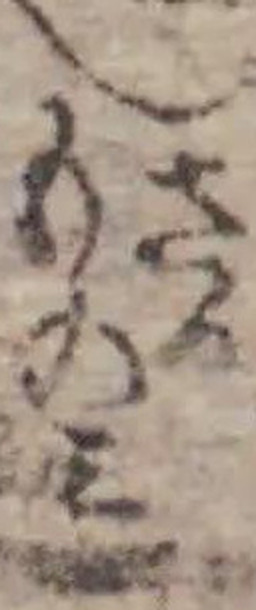ものみ
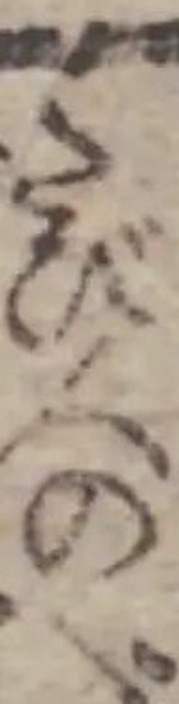たび人の
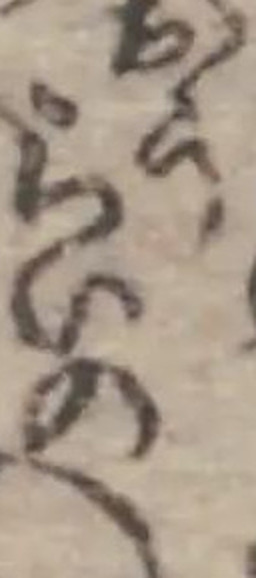らいの
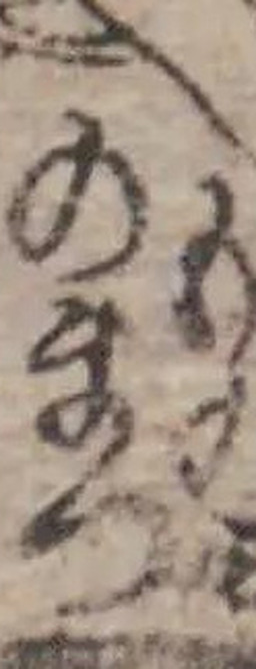のまつ
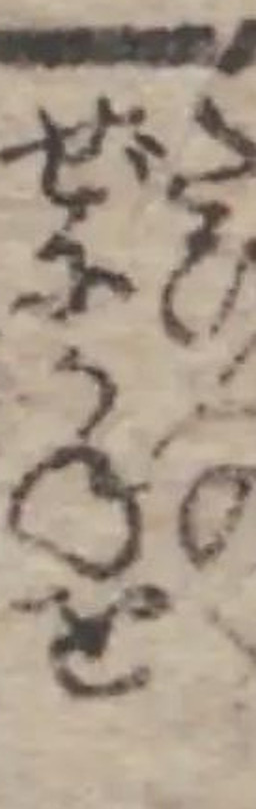ぜにかねを
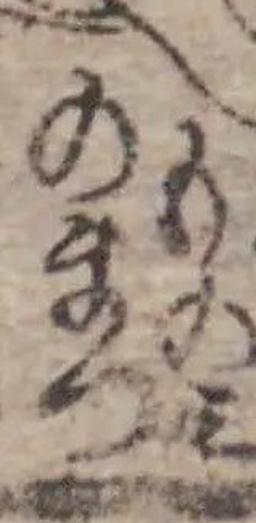のまつ
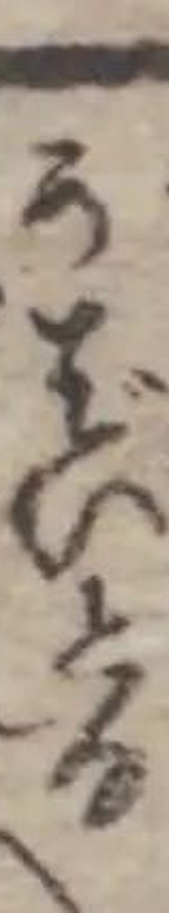うばいとる
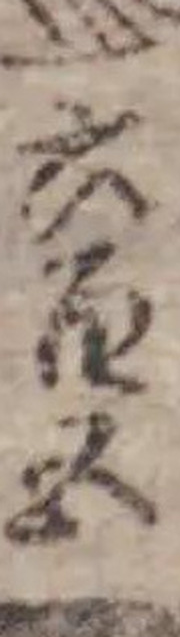六百五
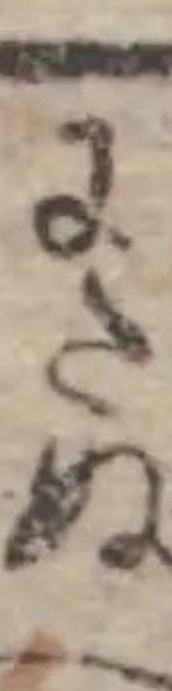にたぬ
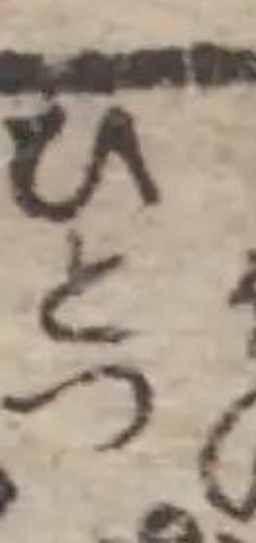ひとつ
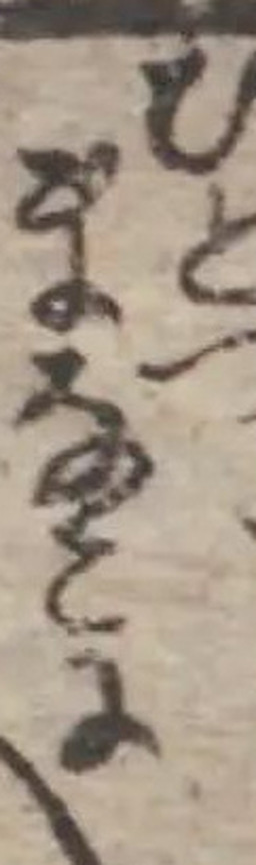まなこに
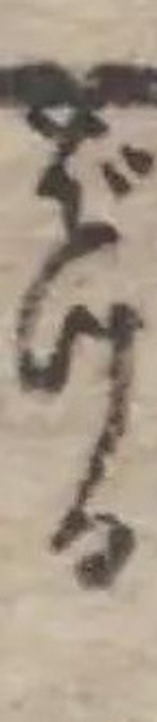ばける
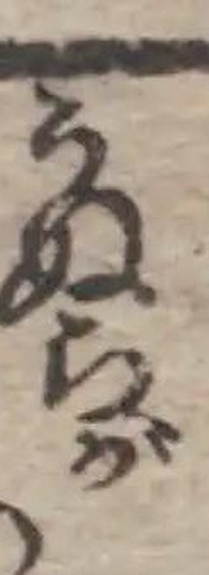うぬらが
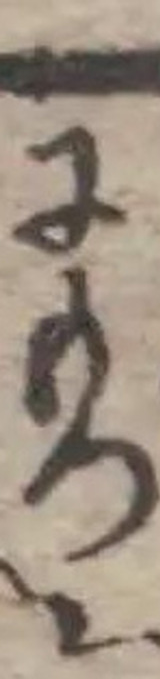にもつ
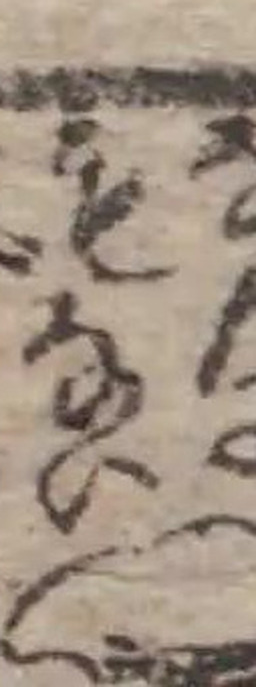もない
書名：大磯地蔵咄 2巻
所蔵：国立国会図書館 National Diet Library, JAPAN
